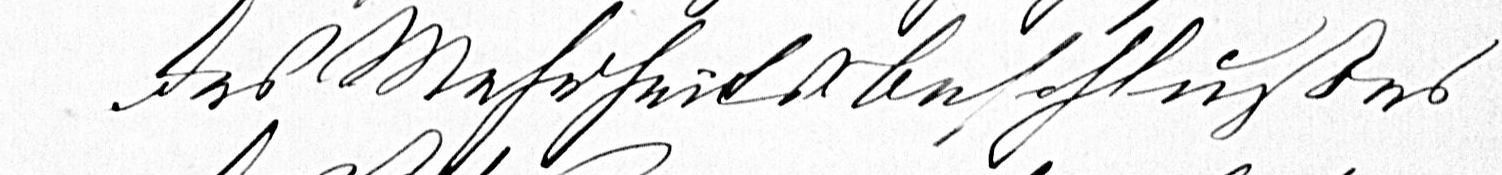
des Mehrheitsbeschlußes
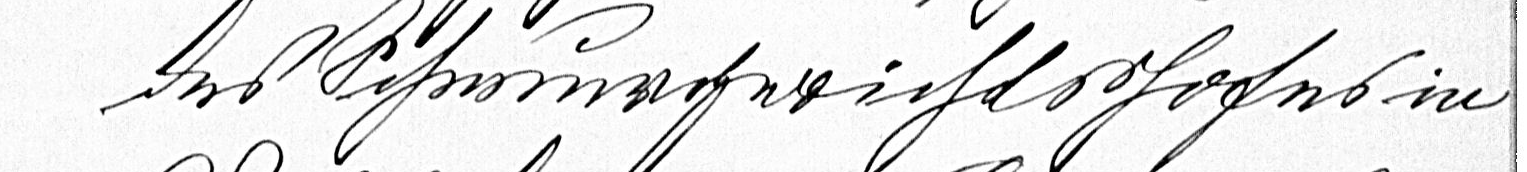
des Schwurgerichtshofes in
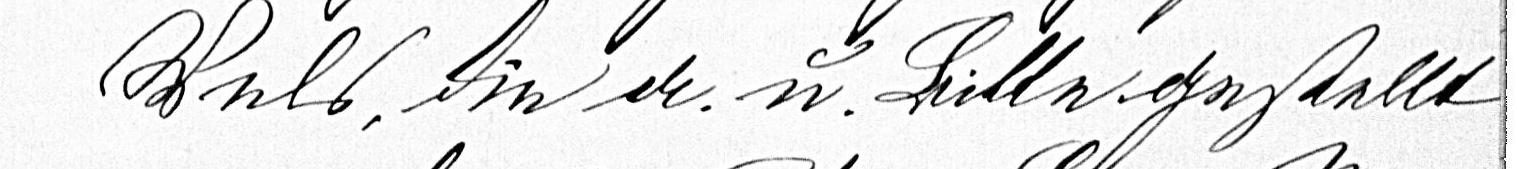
Wels, die a. u. Bitte gestellt
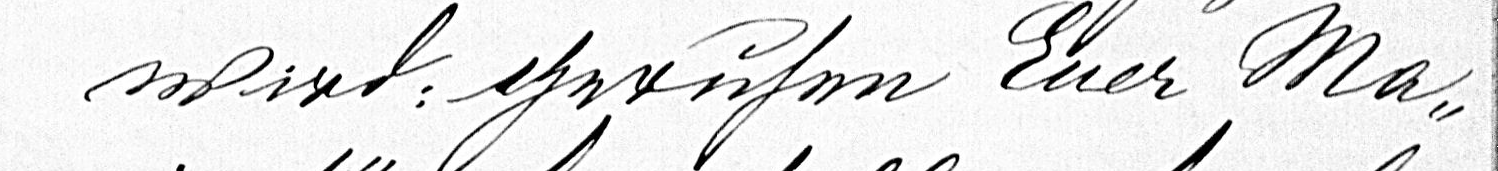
wird: geruhen Euer Ma¬
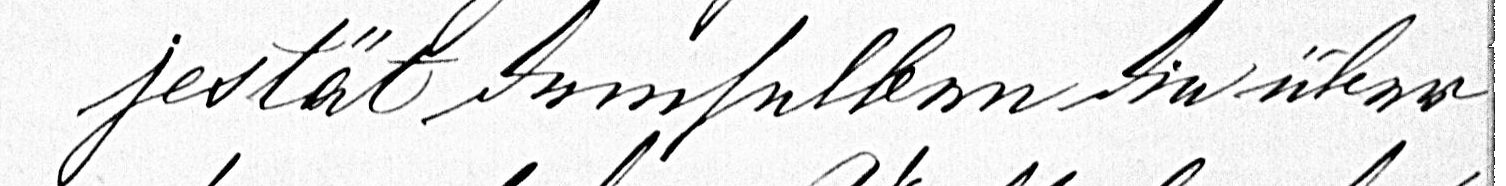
jestät demselben die über
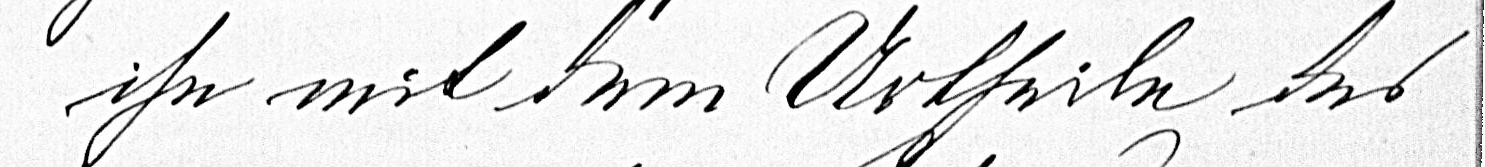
ihn mit dem Urtheile des
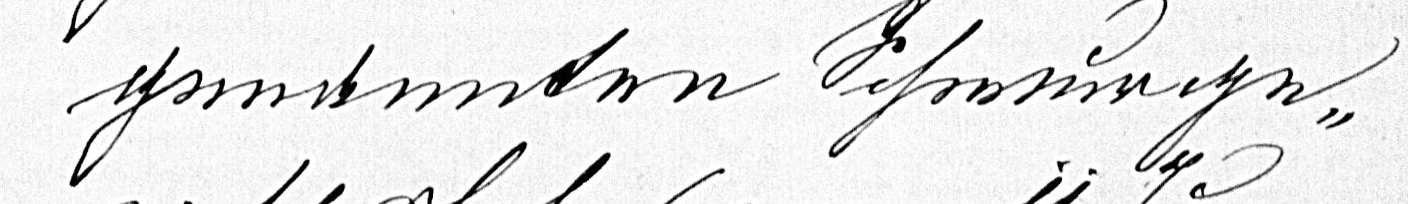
genannten Schwurge¬
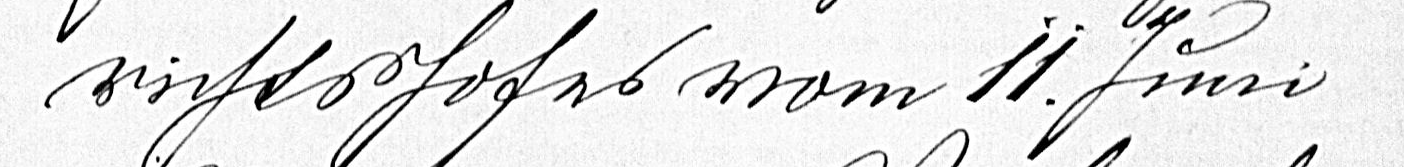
richtshofes vom 11. Juni
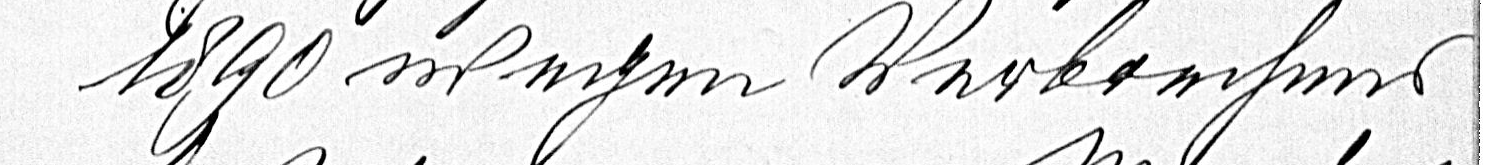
1890 wegen Verbrechens
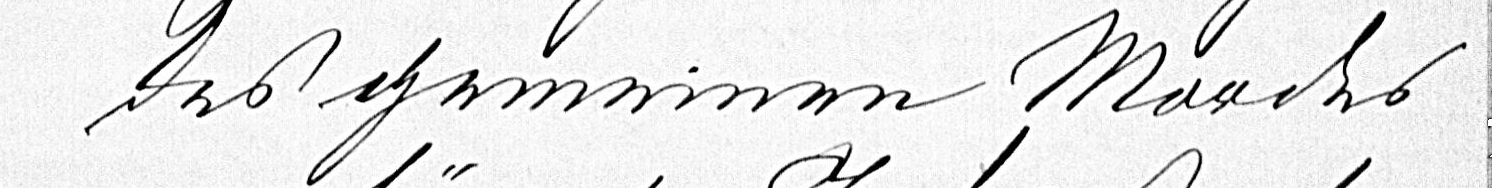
des gemeinen Mordes
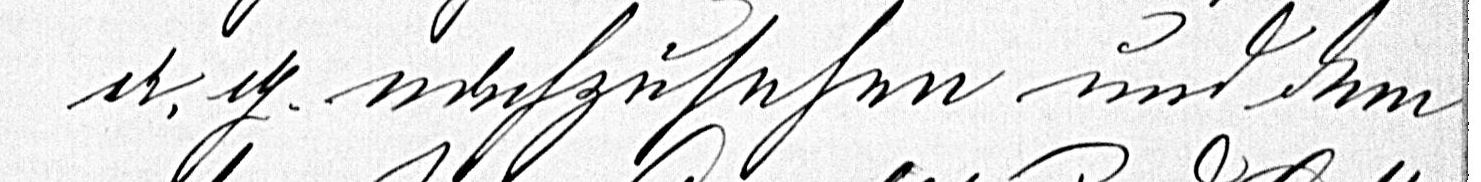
a. g. nachzusehen und dem
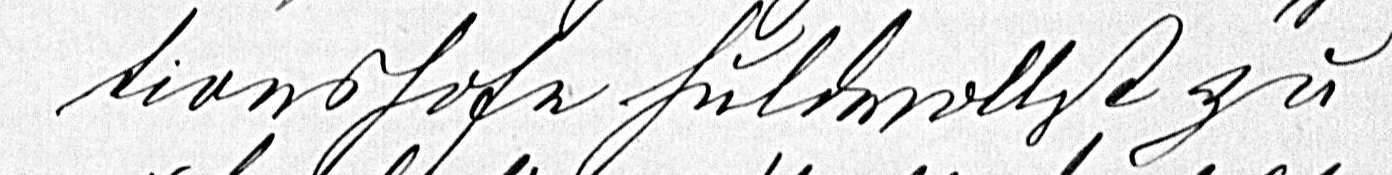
tionshofe huldxx zu
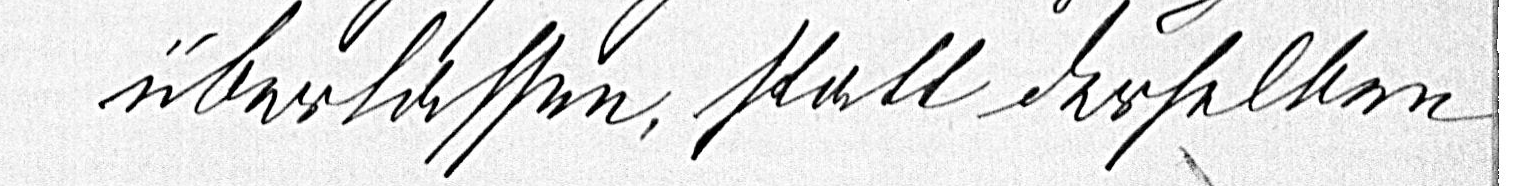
überlassen, statt derselben
